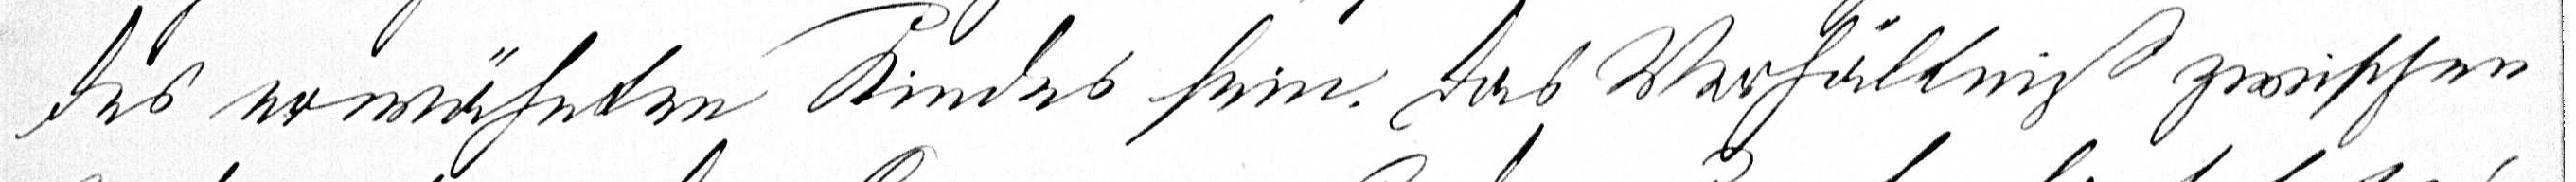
des erwähnten Kindes sein. Das Verhältniß zwischen
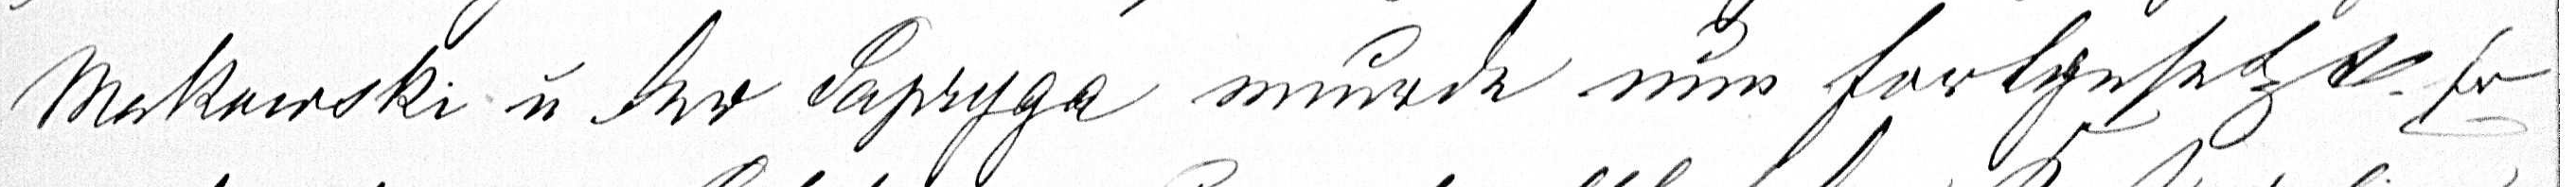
Makowski u der Sapryga wurde nun fortgesetzt. Er
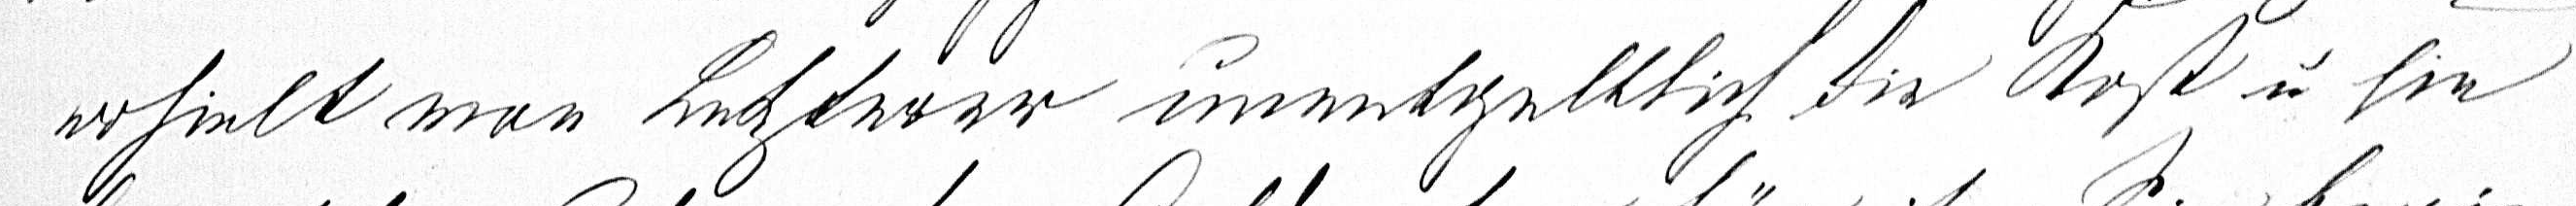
erheilt von letzterer unentgeltlich die Kost u sie
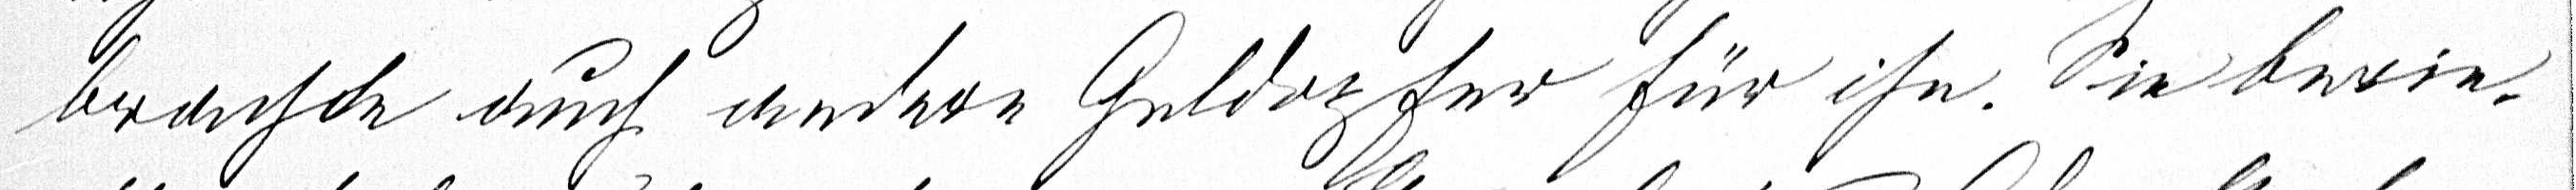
brachte auch andrer Geldopfer für ihn. Sie berie¬
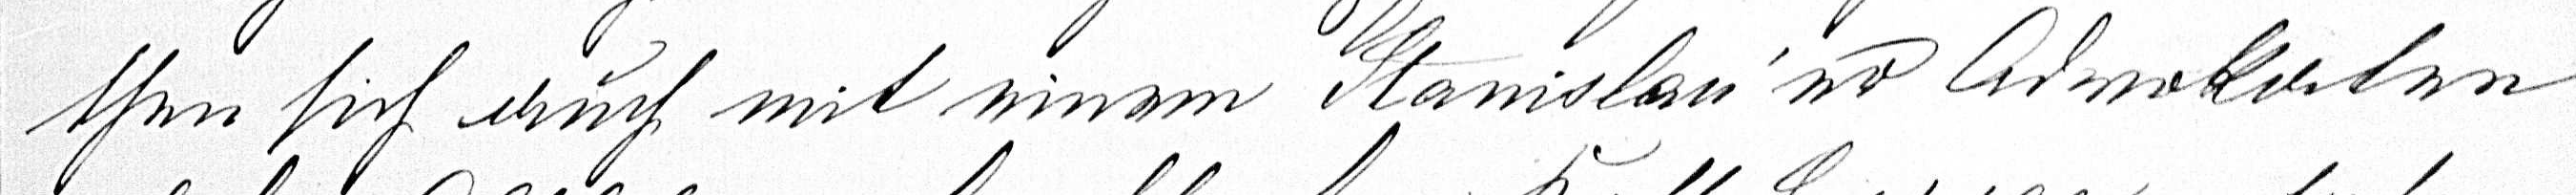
then sich auch mit einem Stanislau’er Adwokaten
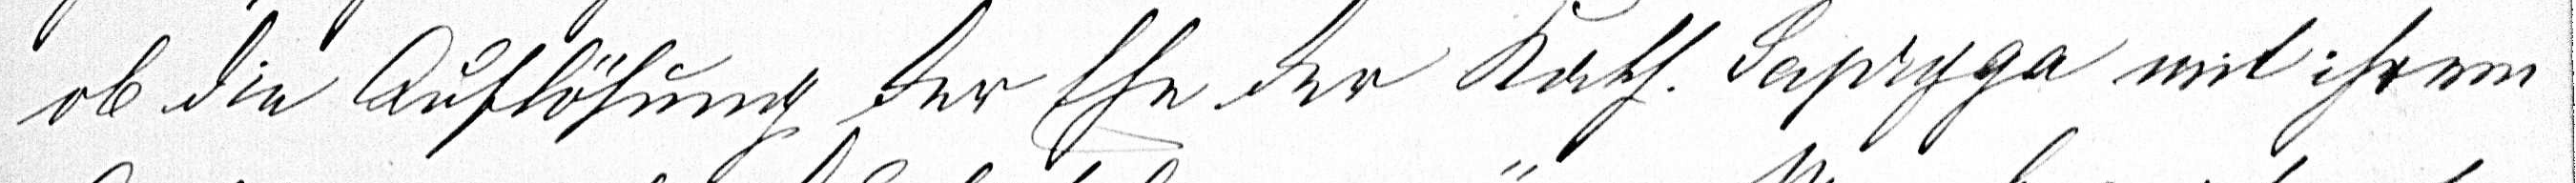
ob die Auflösung der Ehe der Kath. Sapryga mit ihrem
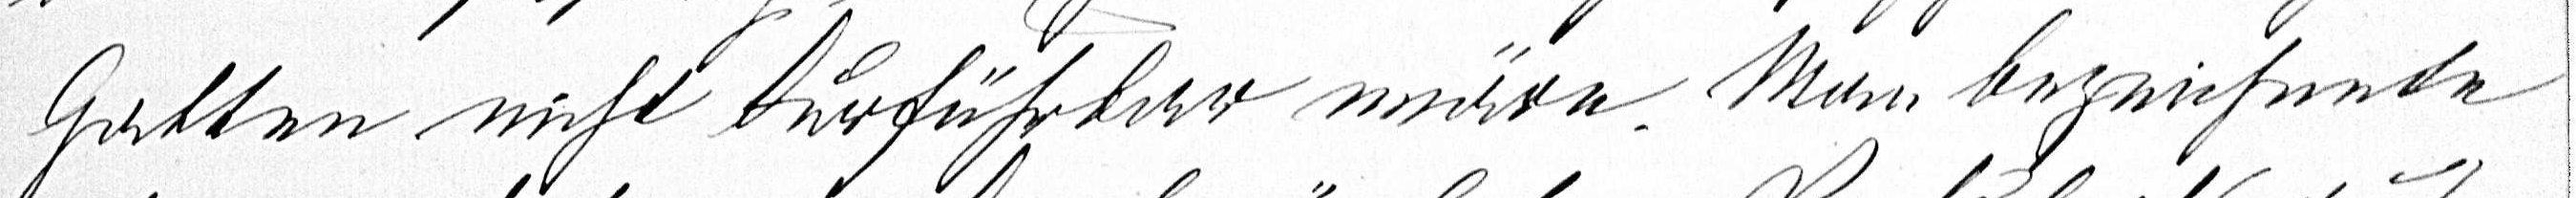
Gatten nicht durführbar wäre. Man bezeichnete
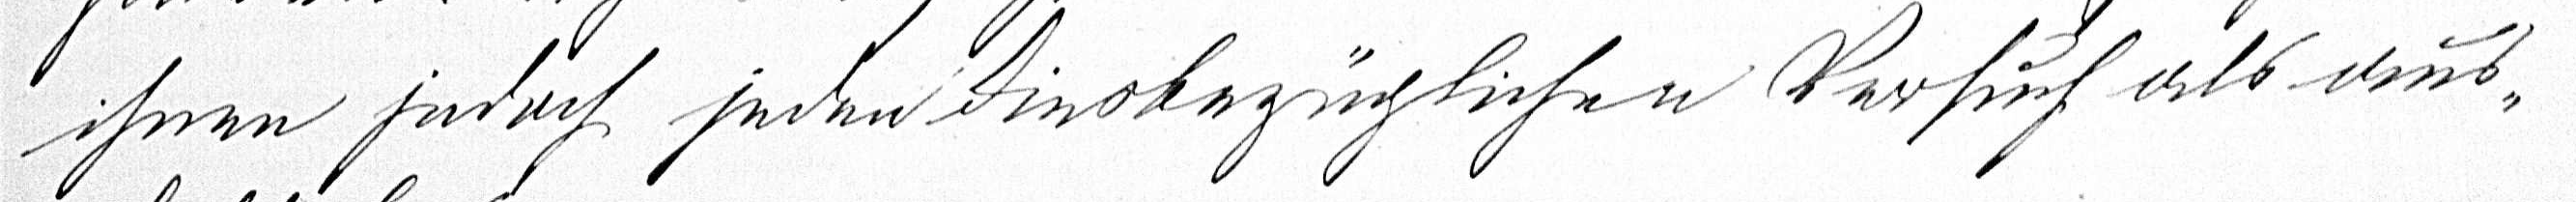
ihren jedoch jeden diesbezüglichen Versuch als aus¬
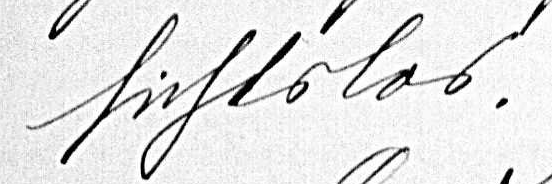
sichtslos.
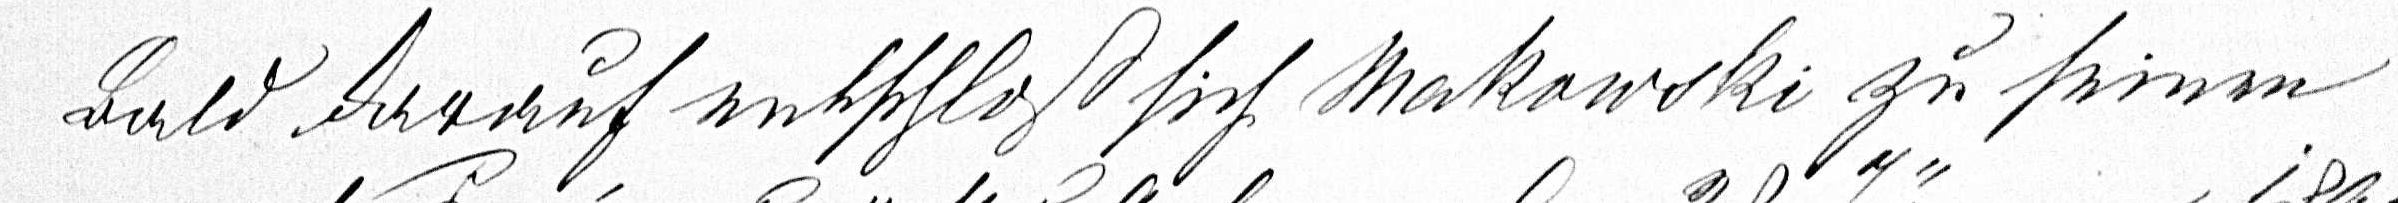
Bald darauf erschloß sich Makowski zu seinen
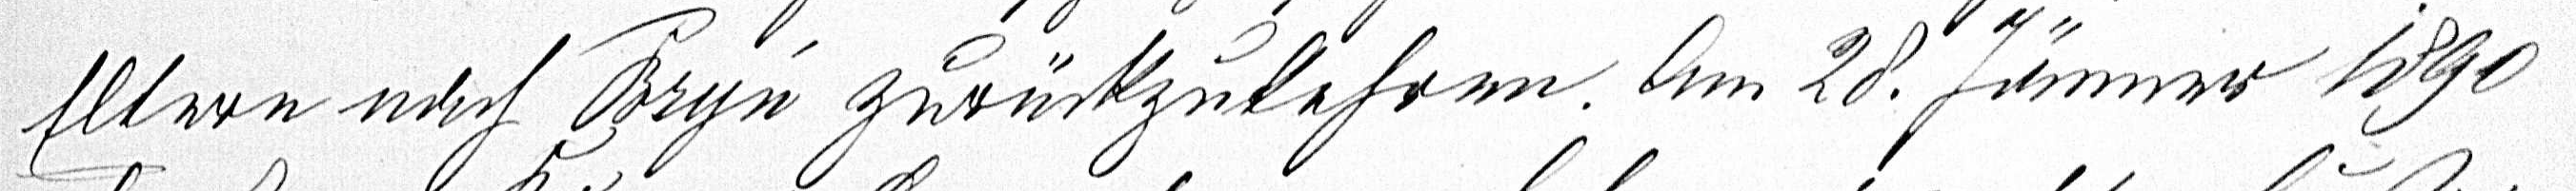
Eltern nach Bryń zurückzukehren. Am 28. Jänner 1890
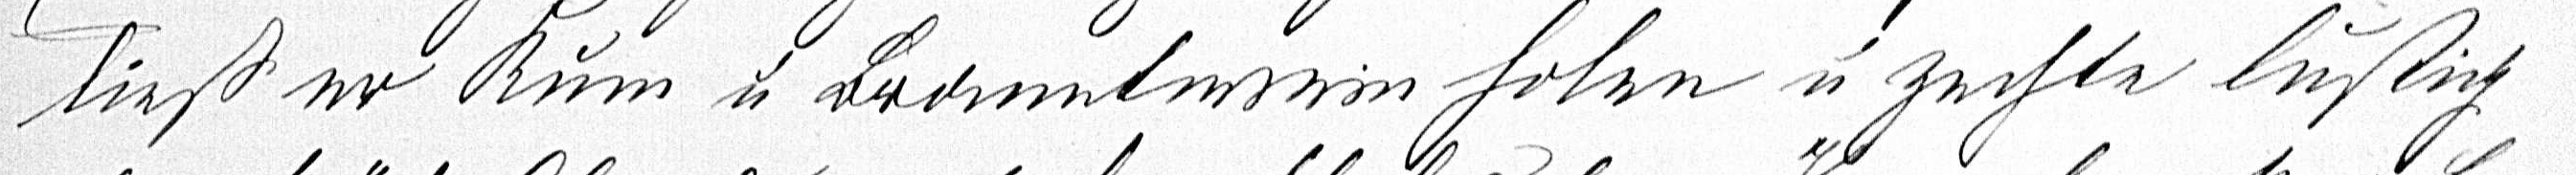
ließ er Rum u Branntwein holen u zechte lustig
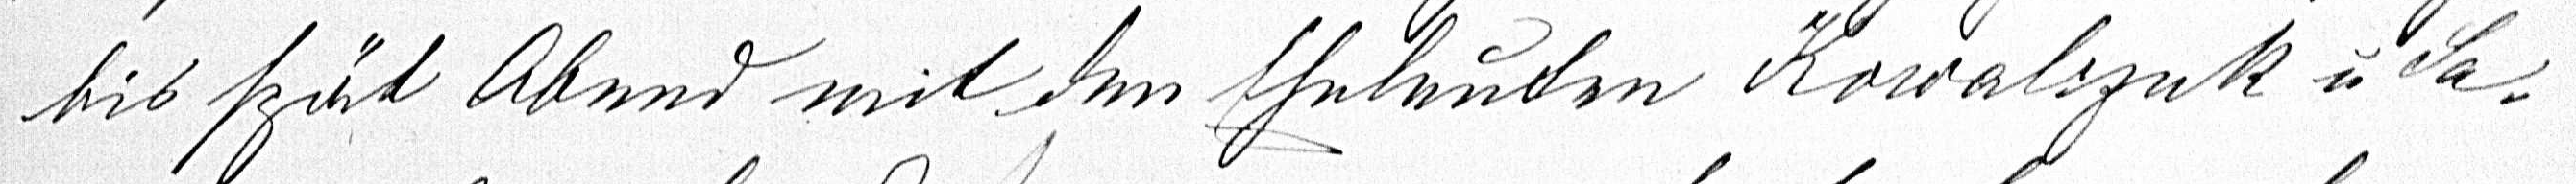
bis spät Abend mit den Eheleute Kowalczuk u Sa¬
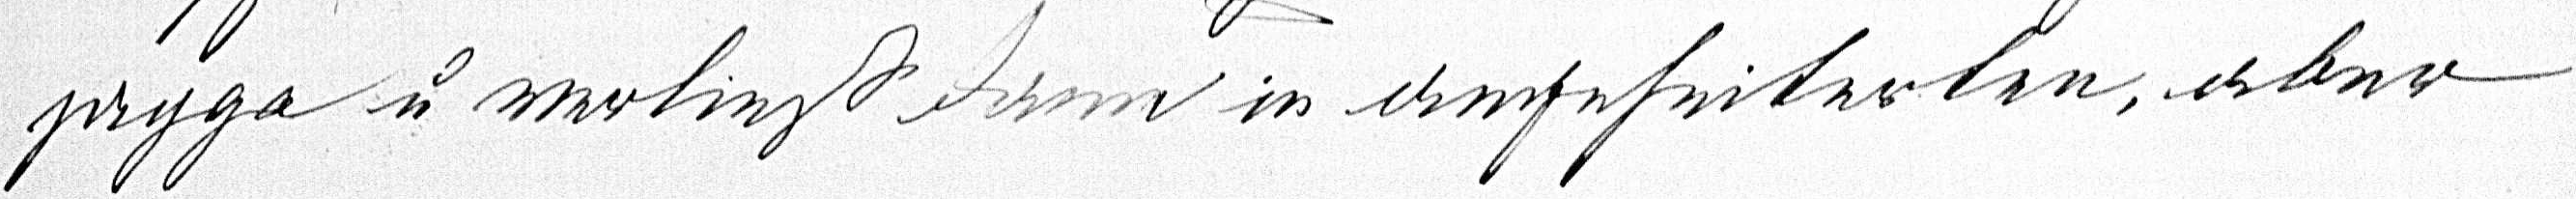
pryga u verließ dann in angeheiterten, aber
